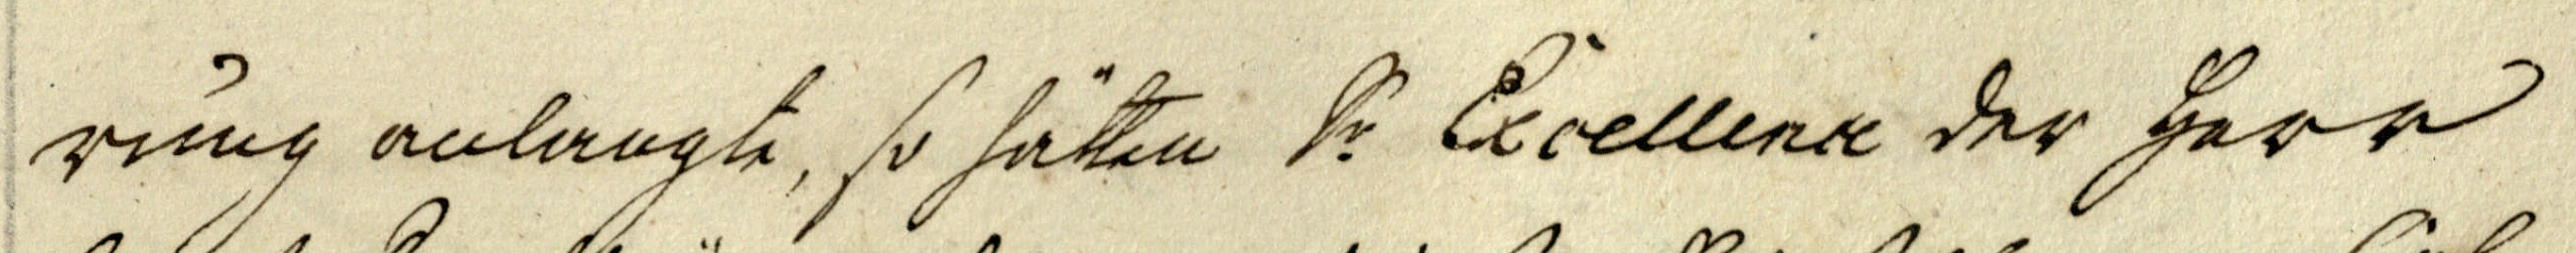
rung anlangte, so hätten Sr Excellence der Herr
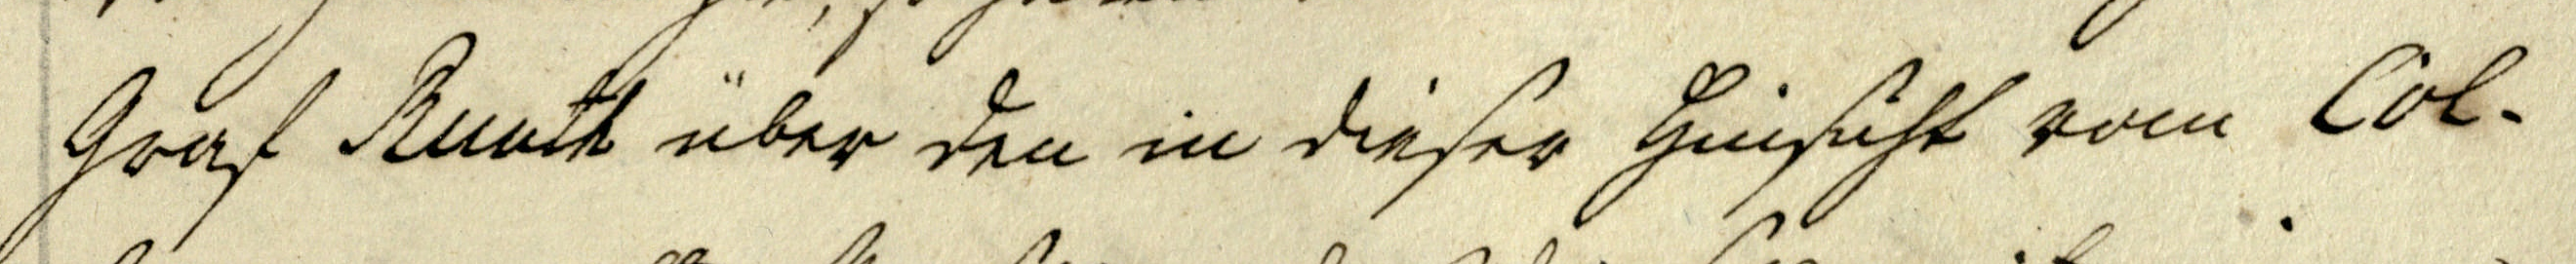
Graf Ruuth über den in dieser Hinsicht vom Col¬
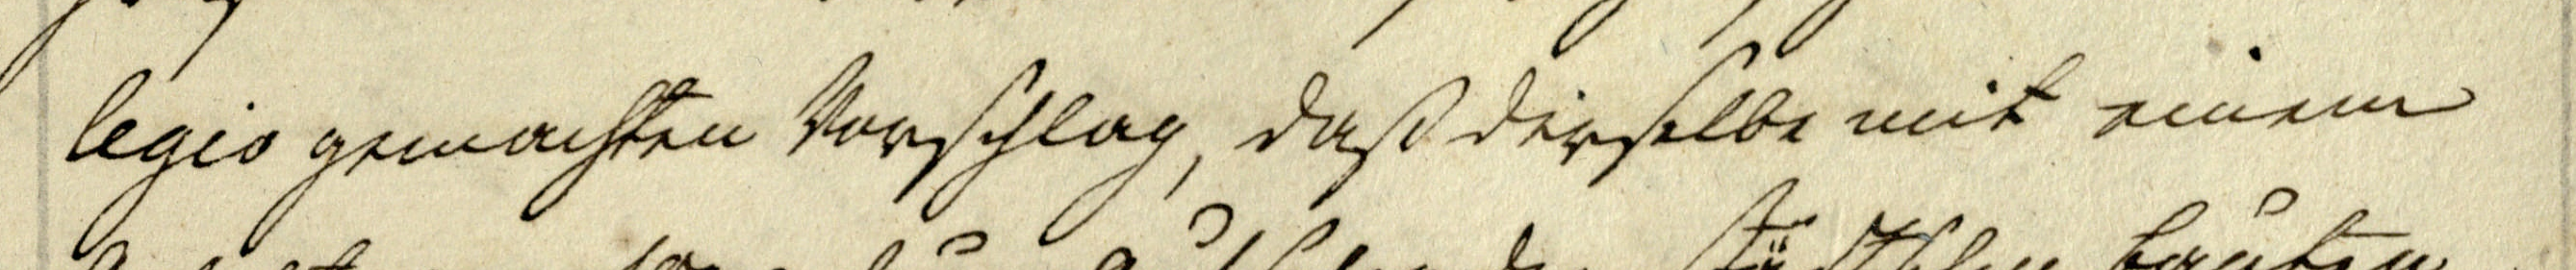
legio gemachten Vorschlag, daß derselbe mit einem
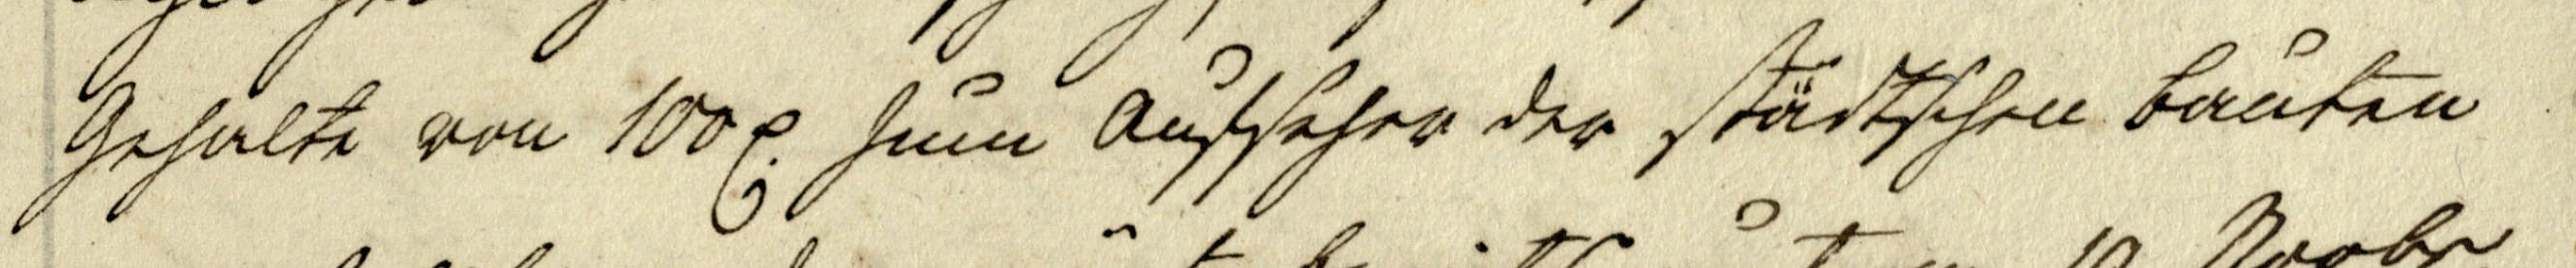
Gehalte von 100 l. zum Aufseher der städtschen Bauten
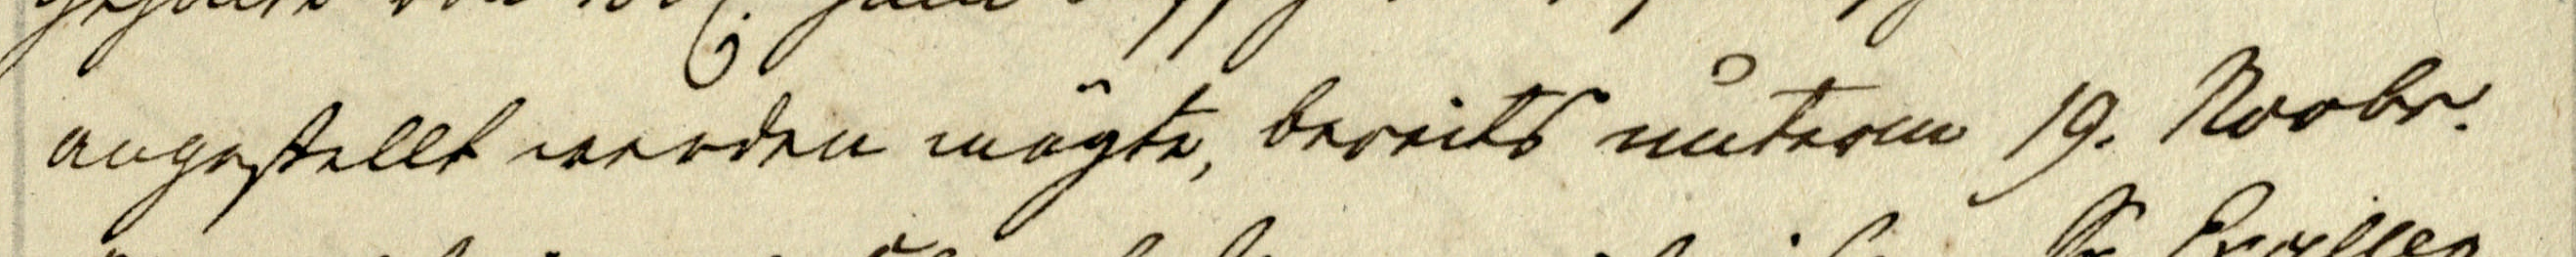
angestellt werden mögte, bereits unterm 19. Novbr.
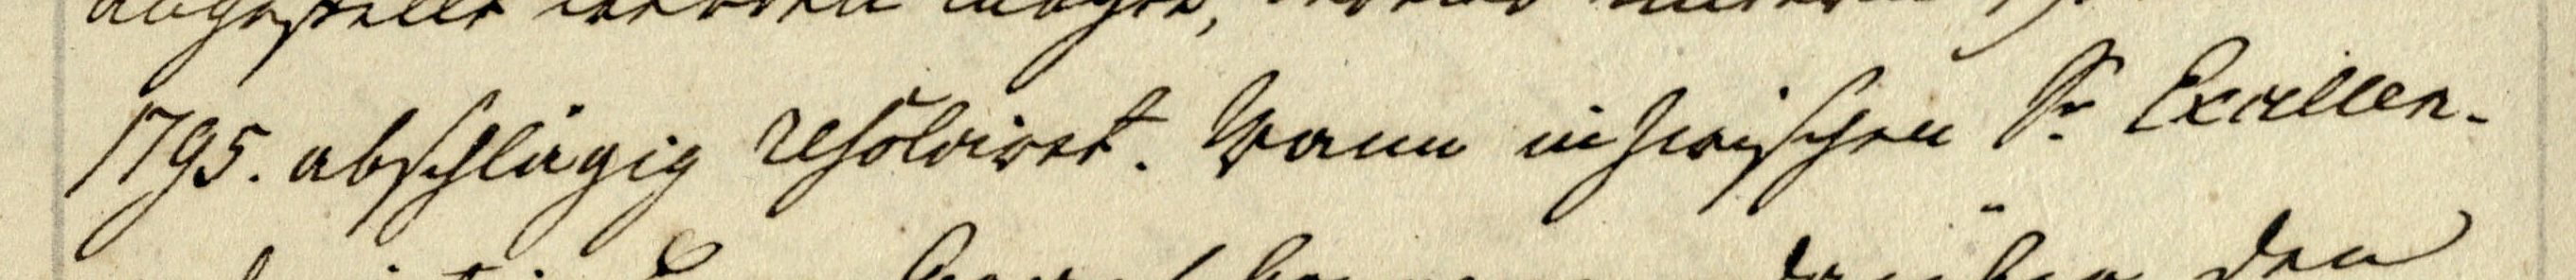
1795. abschlagig resolviret. Wann inzwischen Sr Excellen¬
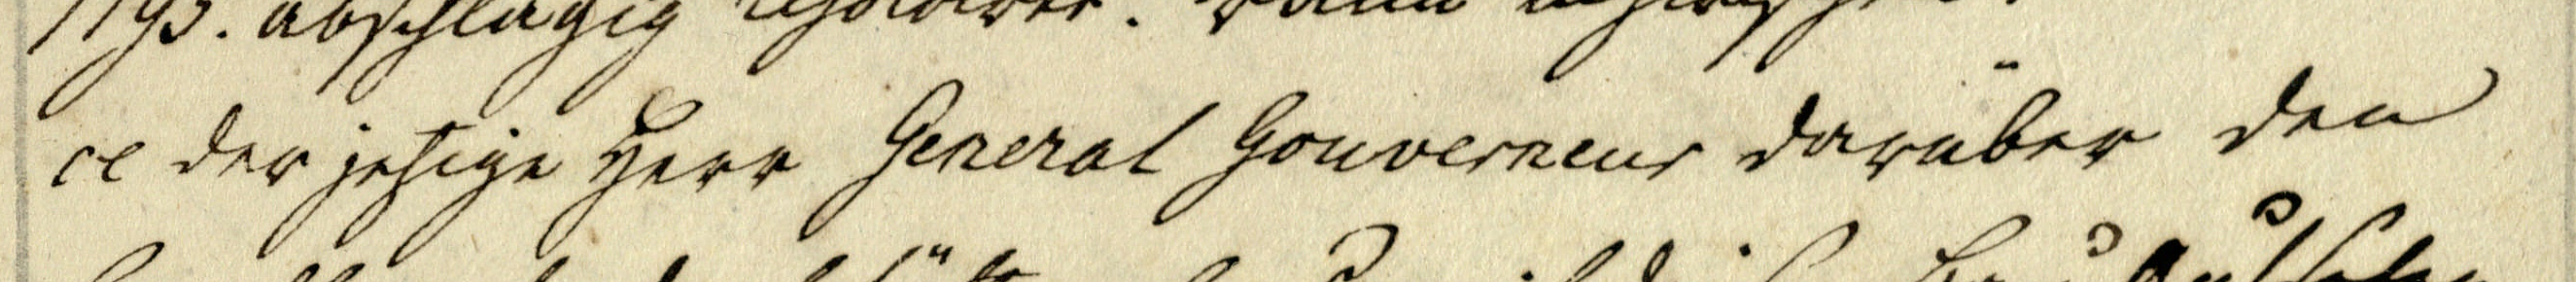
ce der jetzige Herr General Gouverneur darüber den
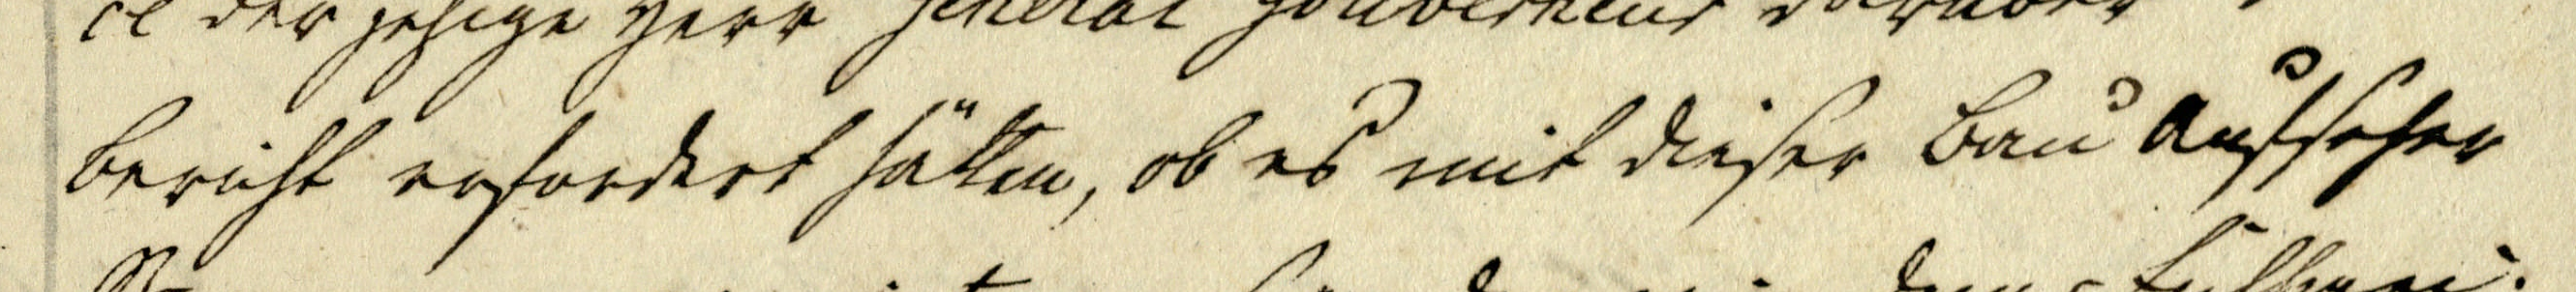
Bericht erfordert hätten, ob es mit dieser Bau Aufseher
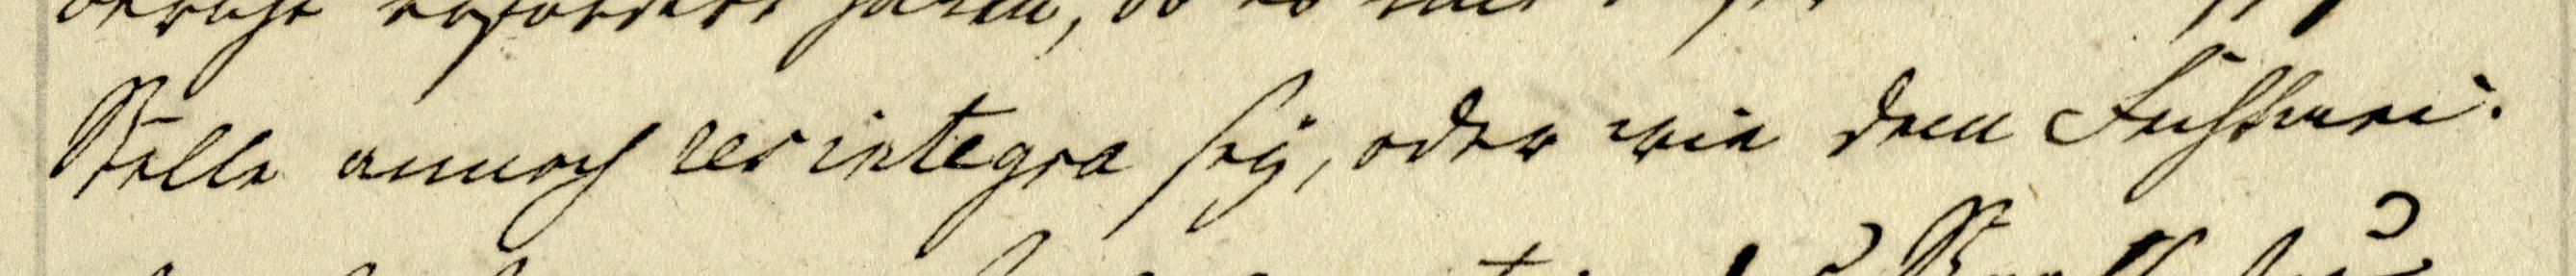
Stelle annoch res integra seÿ, oder wie dem Fechtmei¬
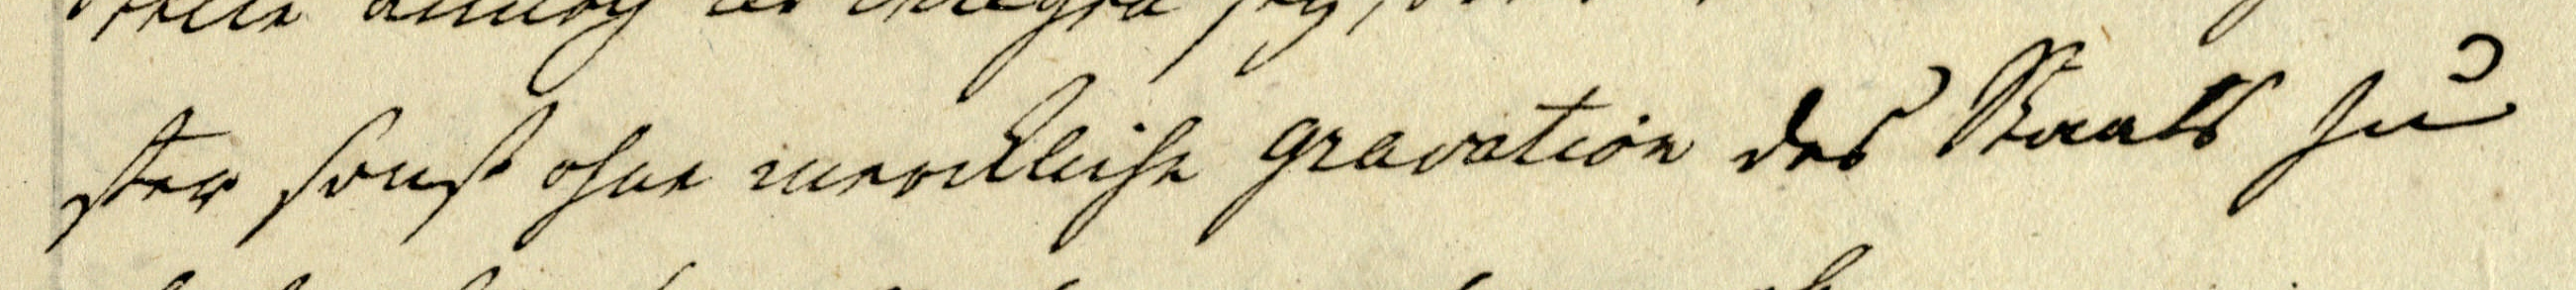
ster sonst ohne merckliche Gravation des Staats zu
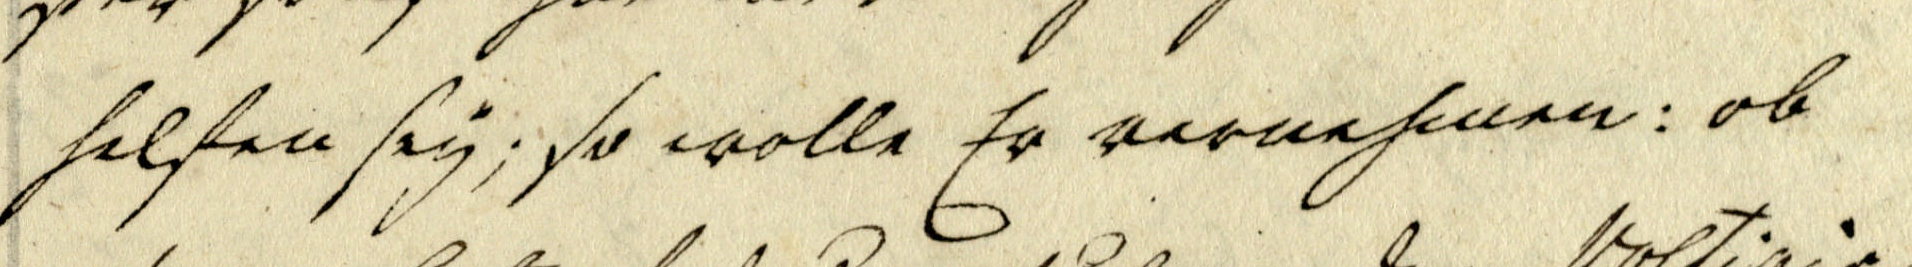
helfen seÿ; so wolle Er vernehmen: ob
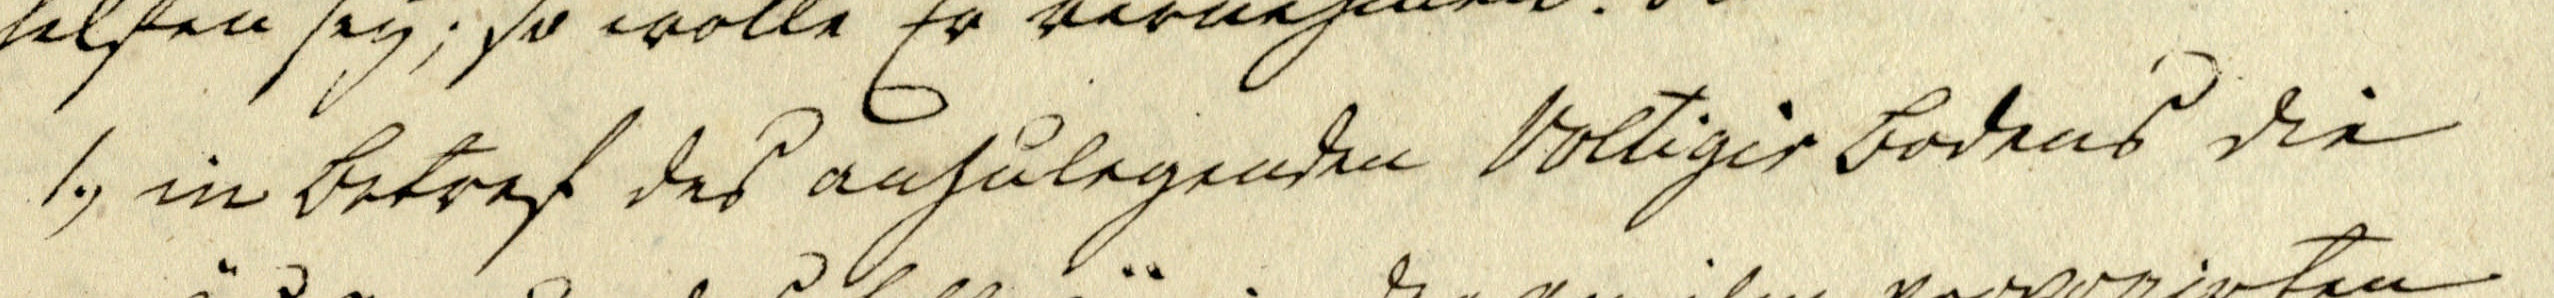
1., in Betref des anzulegenden Voltigir Bodens die
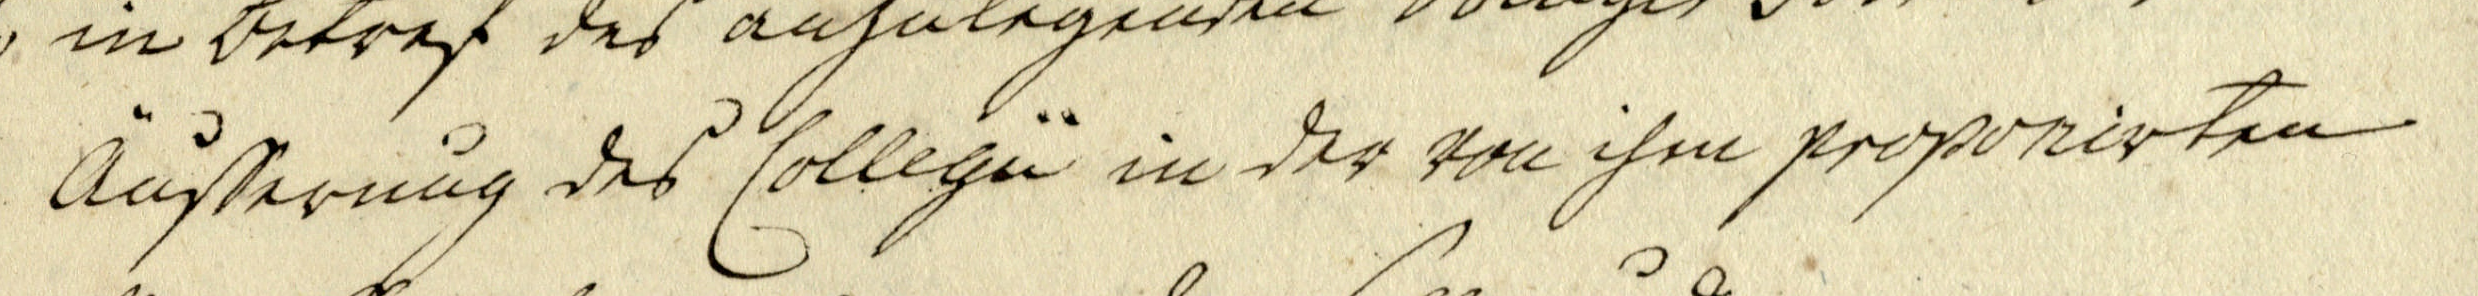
Äusserung des Collegii in der von ihm proponirten
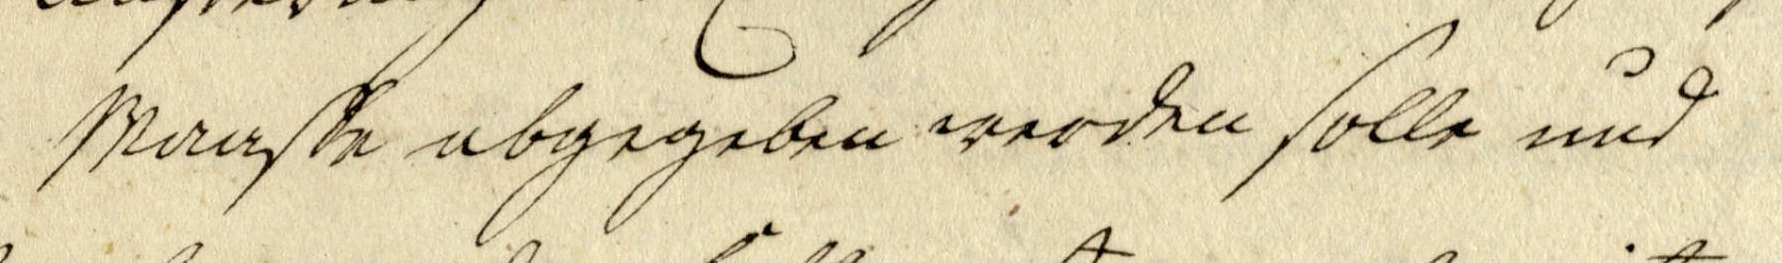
Maasse abgegeben werden solle und
